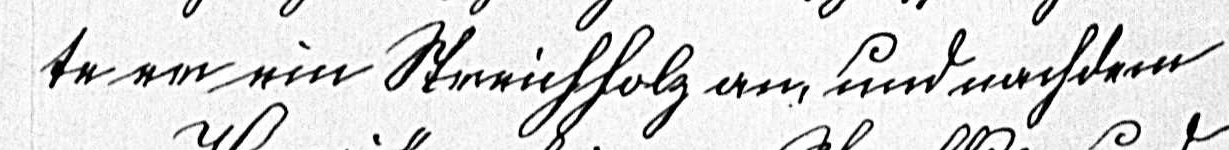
te er ein Streichholz an, und nachdem
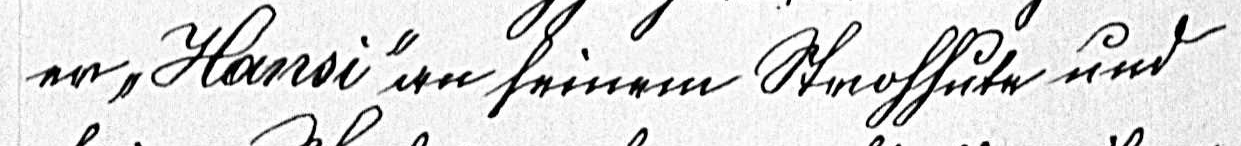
er „Hansi“ an seinem Strohhute und
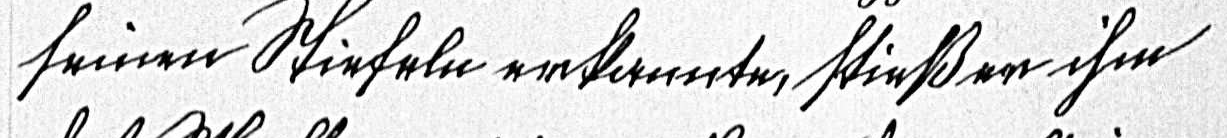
seinen Stiefeln erkannte, stieß er ihm
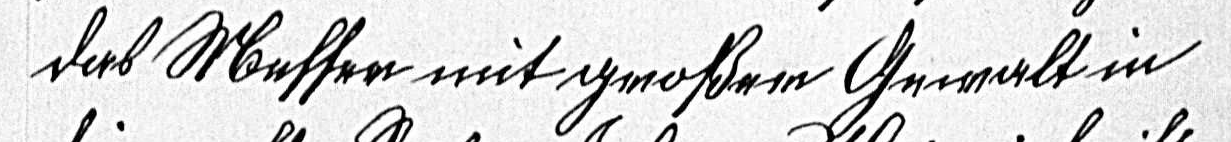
das Messer mit großer Gewalt in
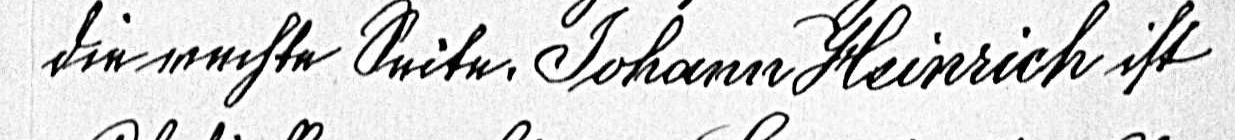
die rechte Seite. Johann Heinrich ist
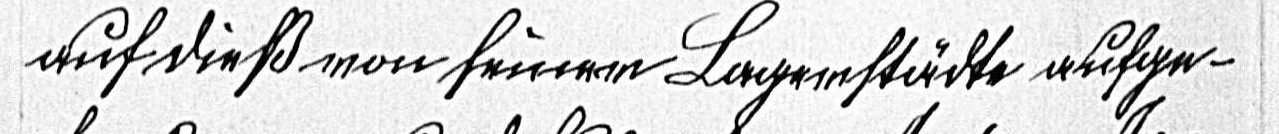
auf dieß von seiner Lagerstädte aufge¬
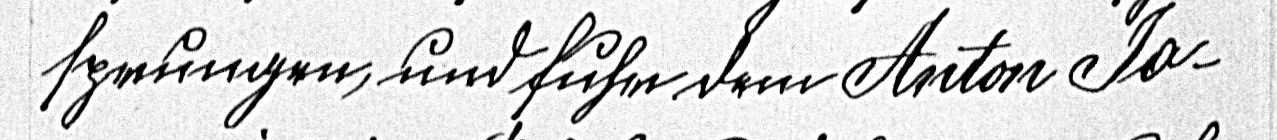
sprungen, und fuhr dem Anton Jo¬
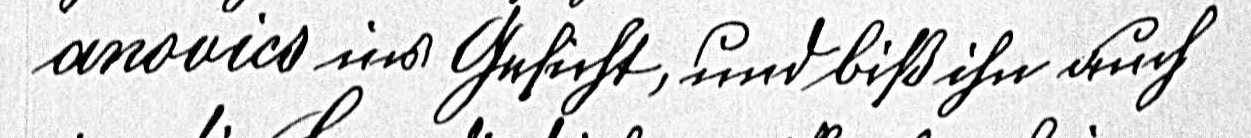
anovics ins Gesicht und biß ihn auch
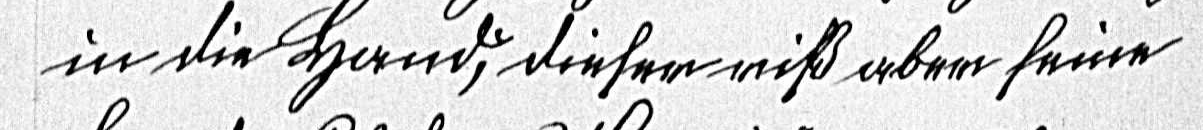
in die Hand, dieser riß aber seine
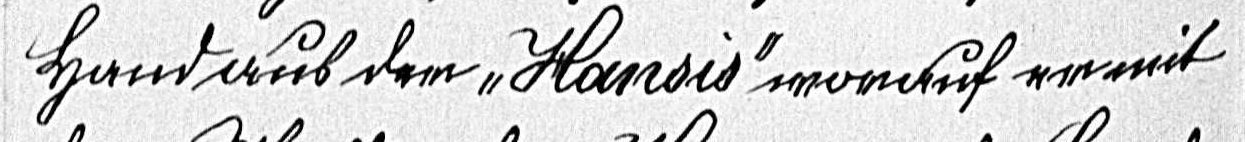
Hand aus der „Hansis“ worauf er mit
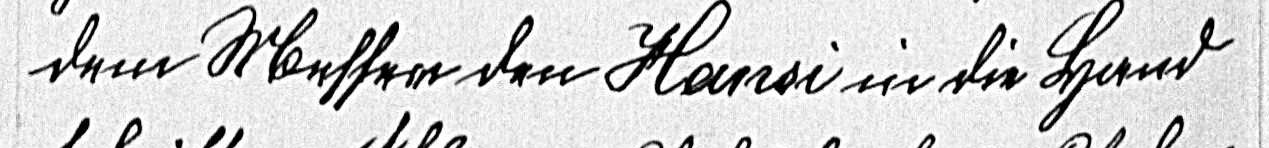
dem Messer den Hansi in die Hand
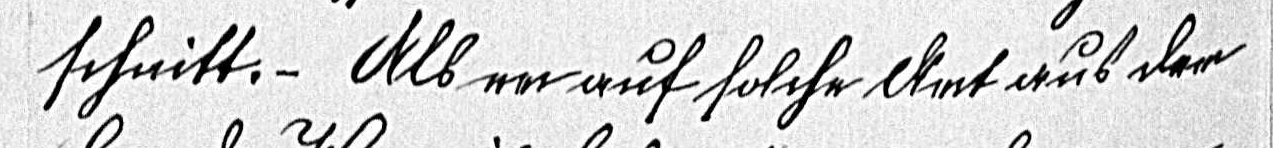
schnitt. Als er auf solche Art aus der
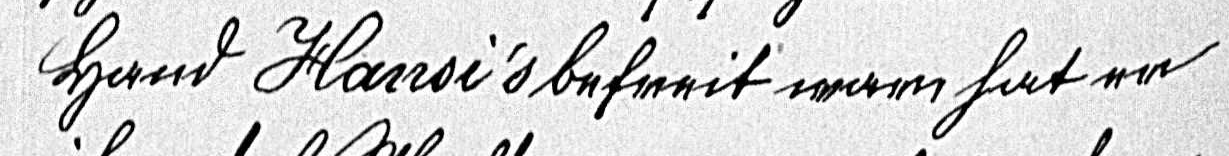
Hand Hansi’s befreit war hat er
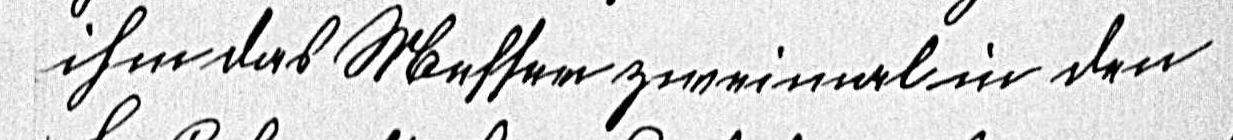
ihm das Messer zweimal in den
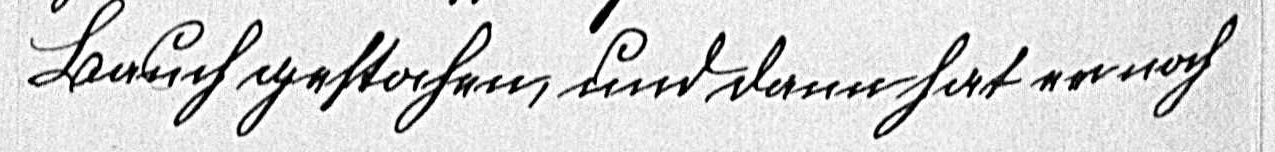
Bauch gestochen, und dann hat er noch
